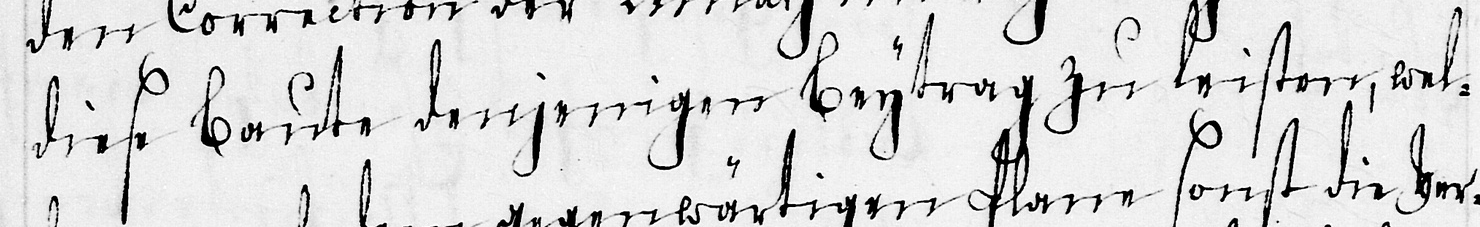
diese Baute denjenigen Beytrag zu leisten, wel¬
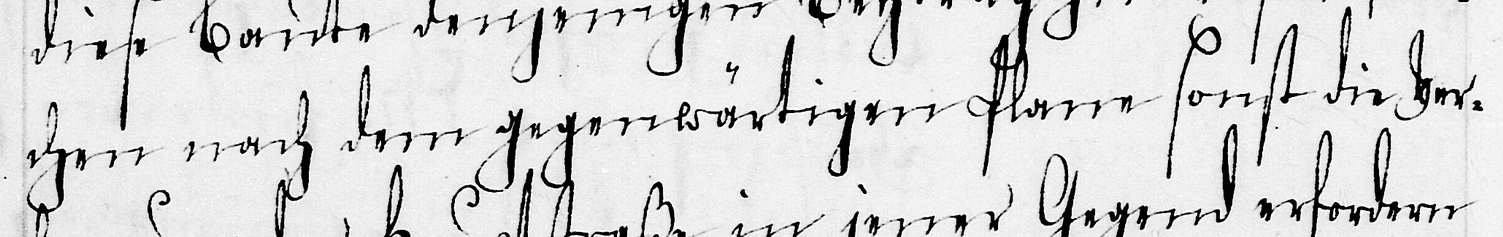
chen nach dem gegenwärtigen Plane sonst die Ver¬
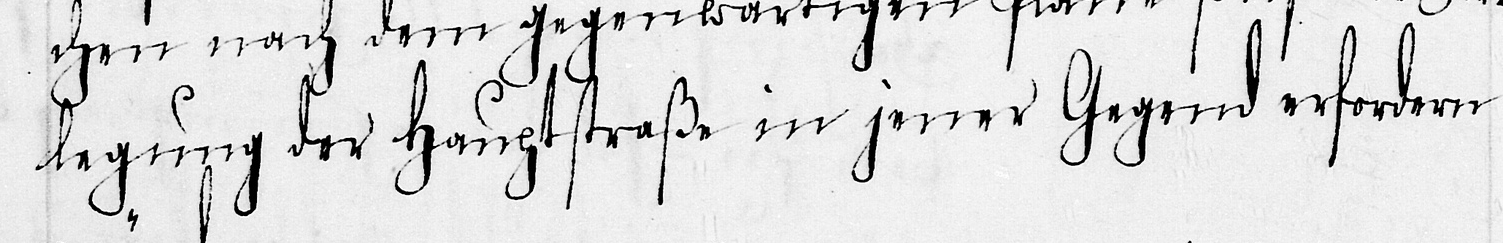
legung der Hauptstraße in jener Gegend erfordern
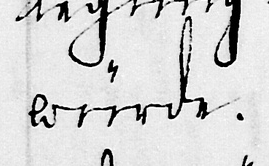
würde.
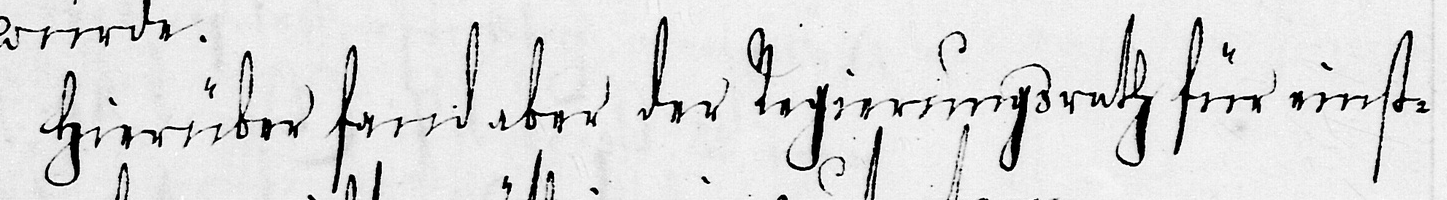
Hierüber fand aber der Regierungsrath für einst¬
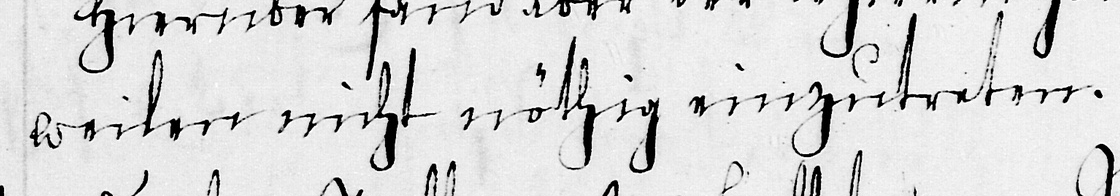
weilen nicht nöthig einzutreten.
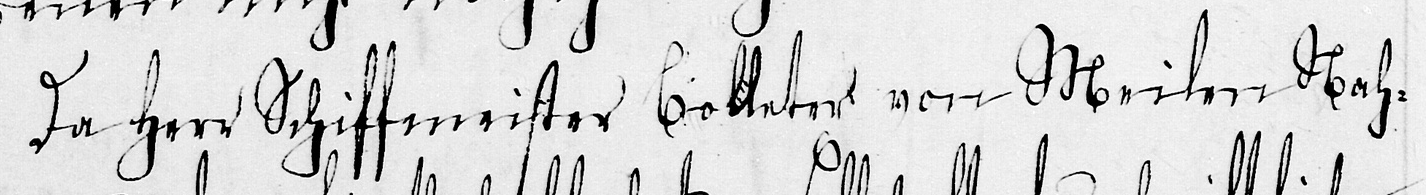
Da Herr Schiffmeister Bolleter von Meilen Nah¬
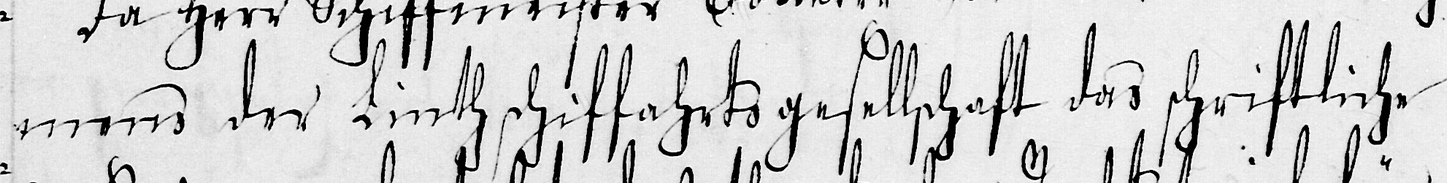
mens der Linthschiffahrtsgesellschaft das schriftliche
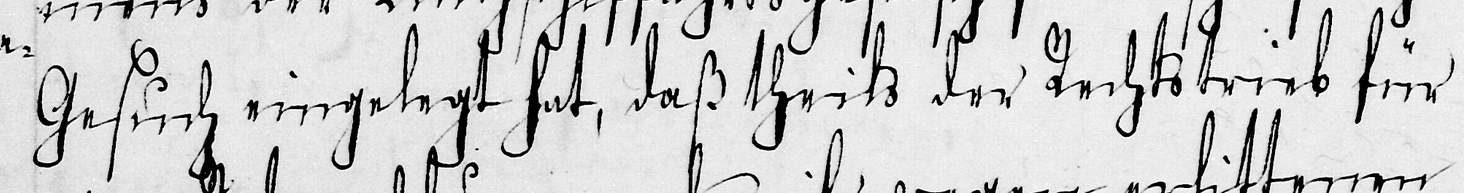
Gesuch eingelegt hat, daß theils der Rechtstrieb für
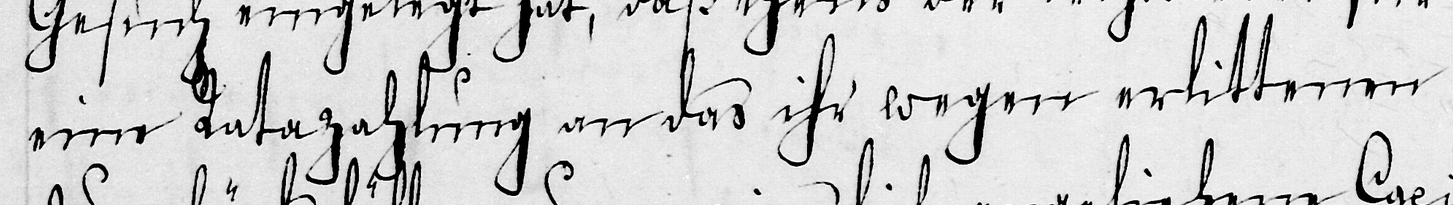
eine Ratazahlung an das ihr wegen erlittenen
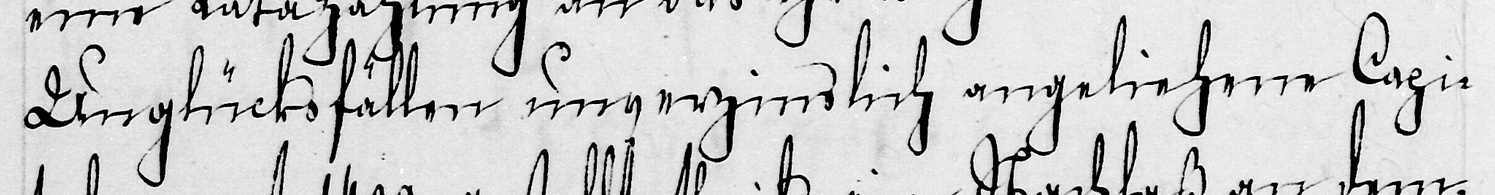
Unglücksfällen unverzinslich angeliehene Capi¬
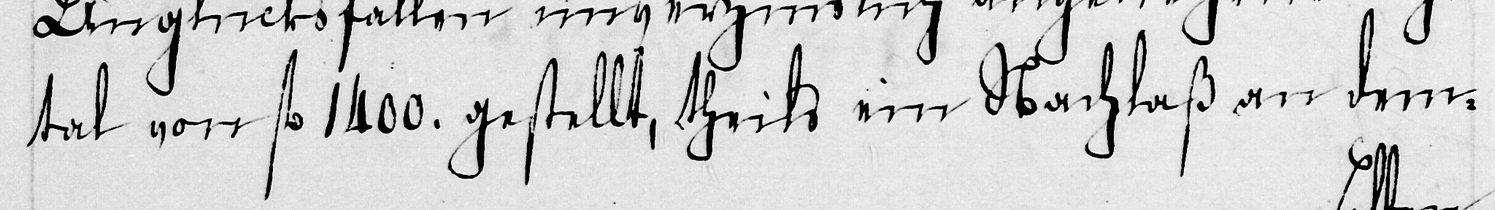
tal von fl. 1400. gestellt, theils ein Nachlaß an dem-
